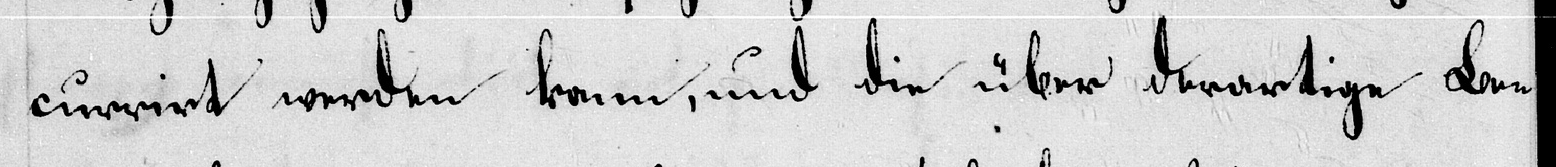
currirt werden kann, und die über derartige Be¬
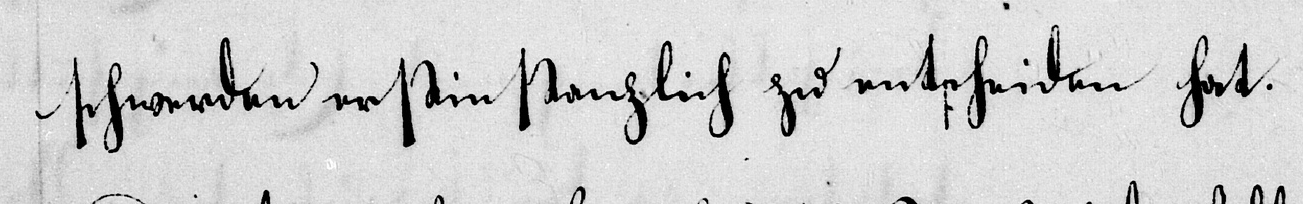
schwerden erstinstanzlich zu entscheiden hat.
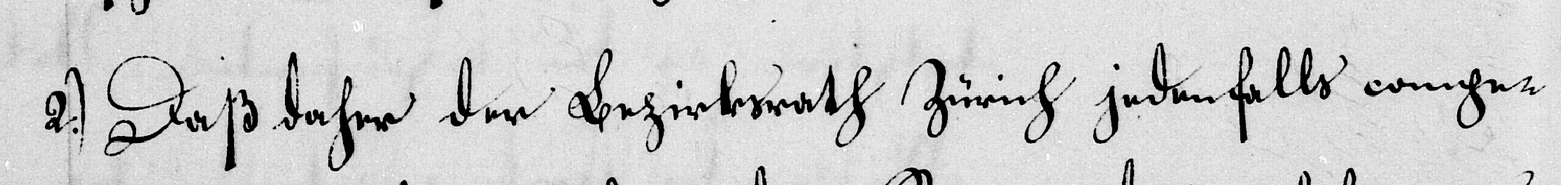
2.) Daß daher der Bezirksrath Zürich jedenfalls compe¬
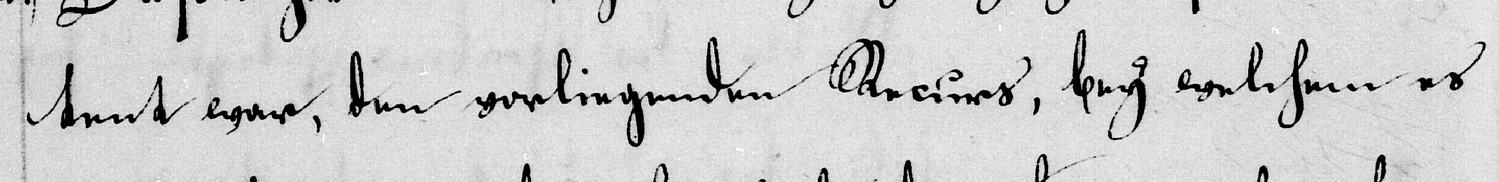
tent war, den vorliegenden Recurs, bey welchem es
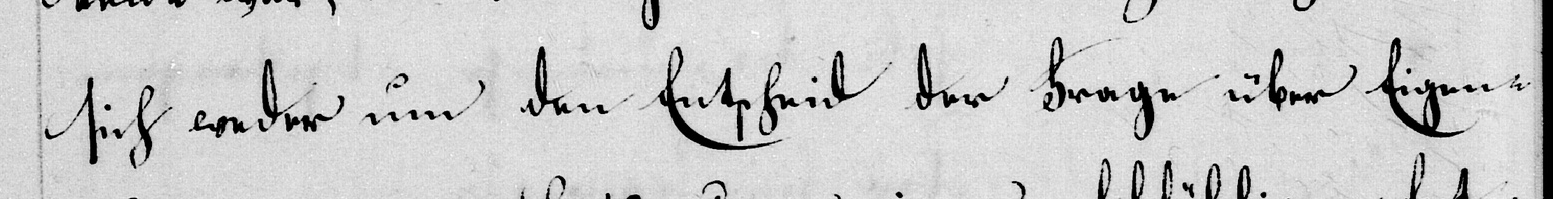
sich weder um den Entscheid der Frage über Eigen¬
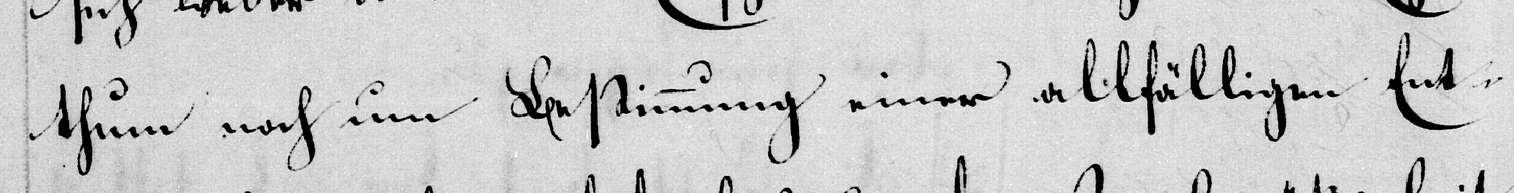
thum noch um Bestimmung einer allfälligen Ent¬
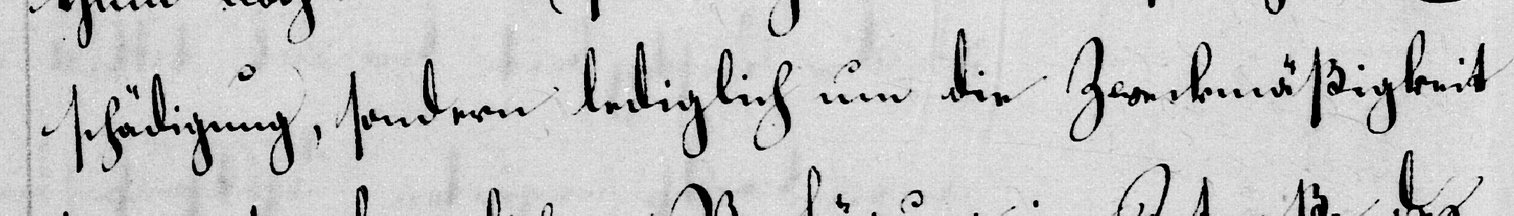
schädigung, sondern lediglich um die Zweckmäßigkeit
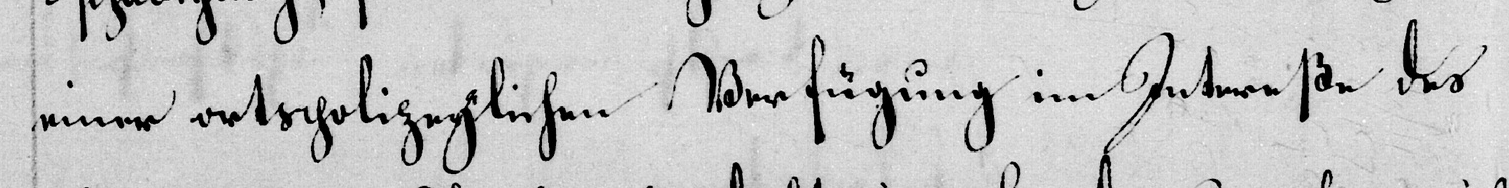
einer ortspolizeylichen Verfügung im Intereße des
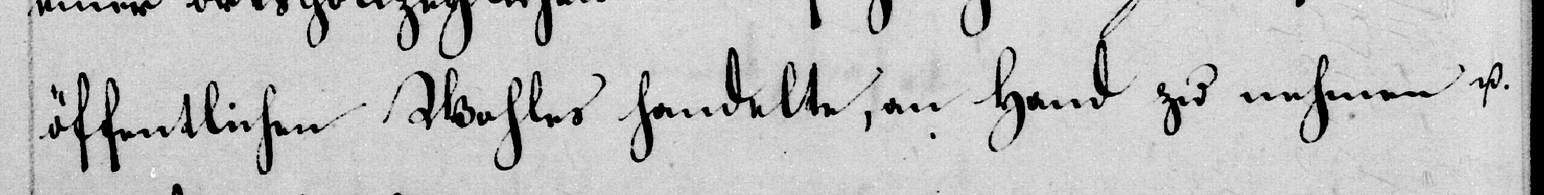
öffentlichen Wohles handelte, an Hand zu nehmen u.
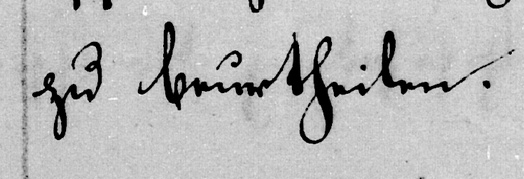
zu beurtheilen.
